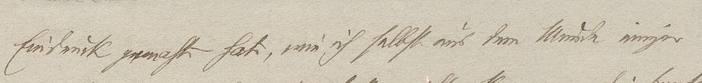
Eindruck gemacht hat, wie ich selbst aus dem Munde einiger
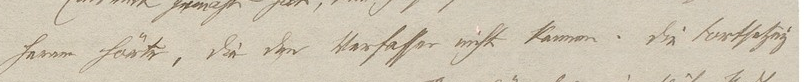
Herren hörte, die den Verfasser nicht kennen. Die Fortsetzung
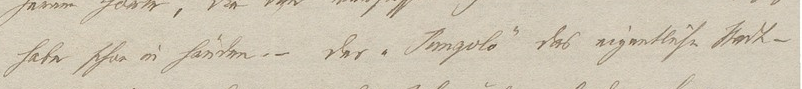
habe schon in Händen. – Der «Pungolo» das eigentliche Stadt-
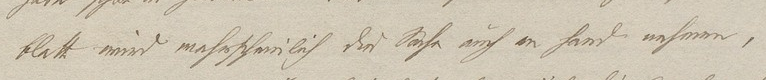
blatt wird wahrscheinlich die Sache auch an Hand nehmen,
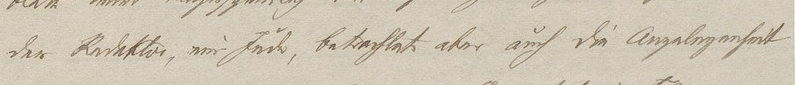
der Redaktor, ein Jude, betrachtet aber auch die Angelegenheit
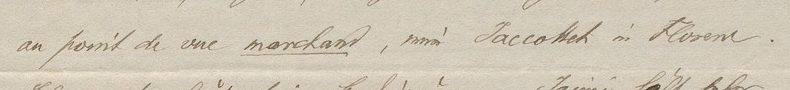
au point de vue marchand, wie Jaccottet in Florenz.
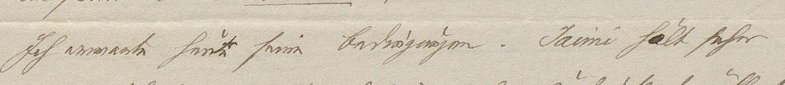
Ich erwarte heute seine Bedingungen. Jacini hält sehr
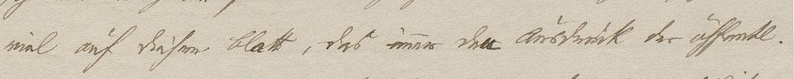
viel auf dieses Blatt, das immer den Ausdruck der öffentl.
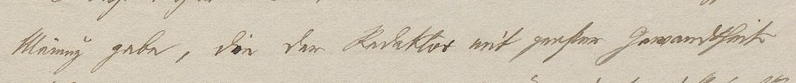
Meinung gebe, die der Redaktor mit großer Gewandtheit
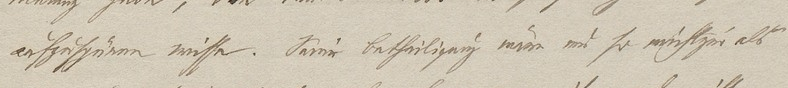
aufzuspüren wisse. Seine Betheiligung wäre um so wichtiger als
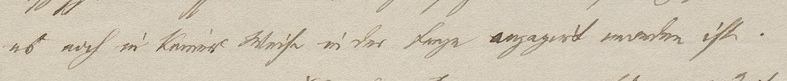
es noch in keiner Weise in der Frage engagirt worden ist.
